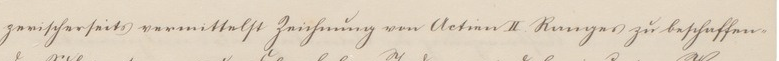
zerischerseits vermittelst Zeichnung von Actien II. Ranges zu beschaffen-
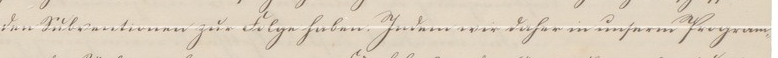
den Subventionen zur Folge haben. Indem wir daher in unserm Program-
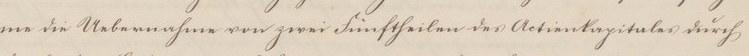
me die Uebernahme von zwei Fünftheilen des Actienkapitales durch
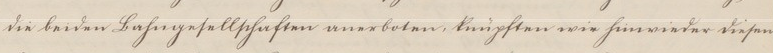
die beiden Bahngesellschaften anerboten, knüpften wir hinwieder diesen
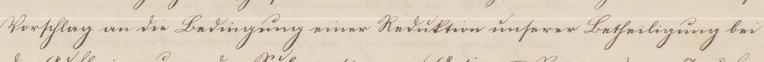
Vorschlag an die Bedingung einer Reduktion unserer Betheiligung bei
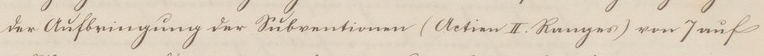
der Aufbringung der Subventionen (Actien II. Ranges) von 7 auf
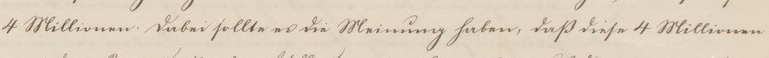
4 Millionen. Dabei sollte es die Meinung haben, daß diese 4 Millionen
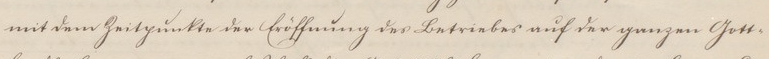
mit dem Zeitpunkte der Eröffnung des Betriebes auf der ganzen Gott-
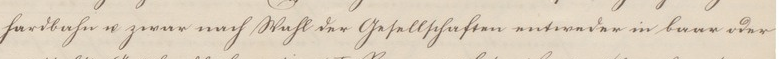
hardbahn & zwar nach Wahl der Gesellschaften entweder in baar oder
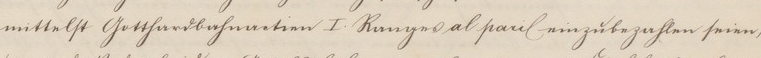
mittelst Gotthardbahnactien I. Ranges al pari einzubezahlen seien,
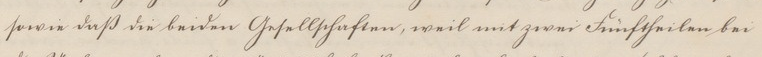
sowie daß die beiden Gesellschaften, weil mit zwei Fünftheilen bei
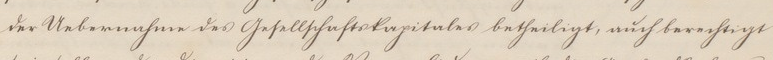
der Uebernahme des Gesellschaftskapitales betheiligt, auch berechtigt
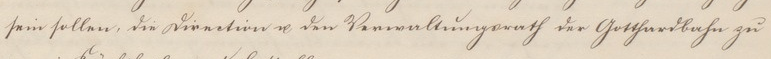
sein sollen, die Direction & den Verwaltungsrath der Gotthardbahn zu
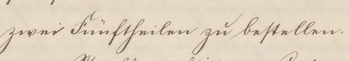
zwei Fünftheilen zu bestellen.
